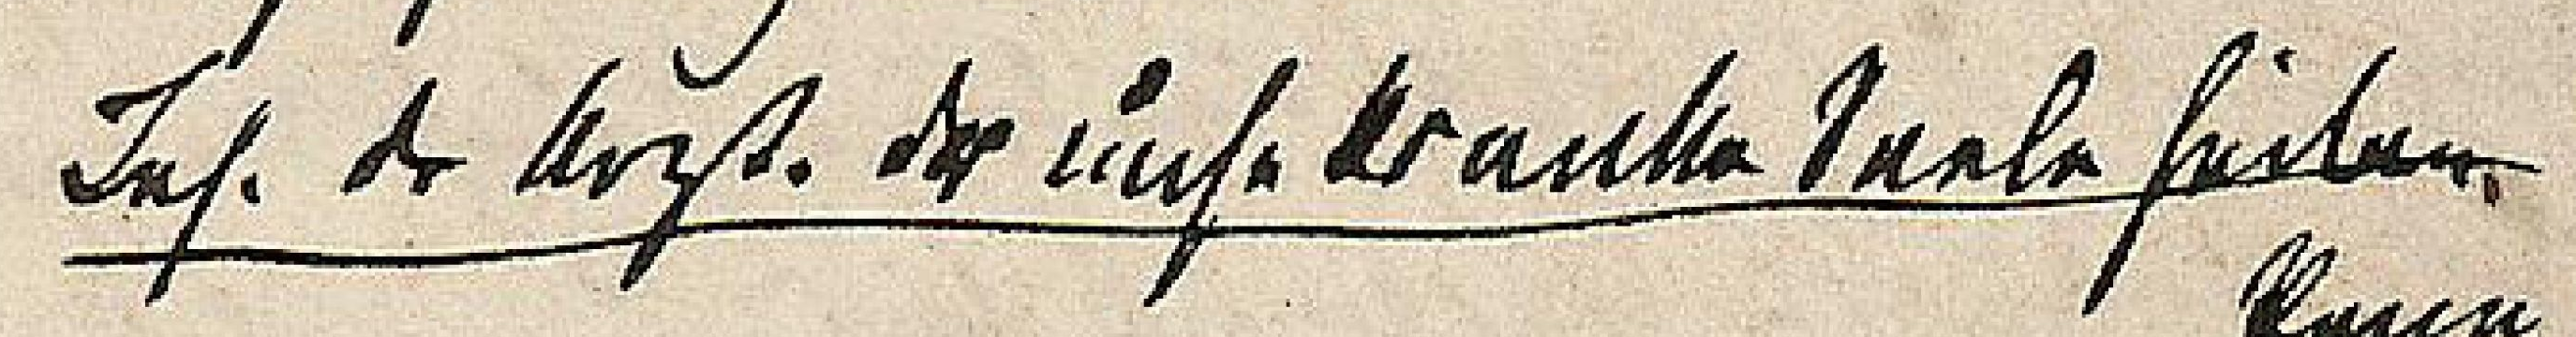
Jes. dr. Arzt der unsr kranke Seele heilen.
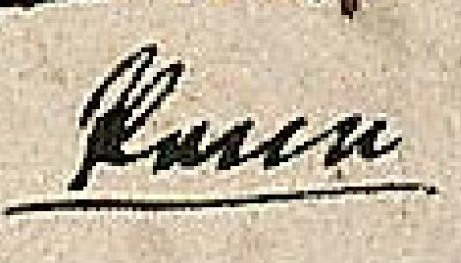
kann
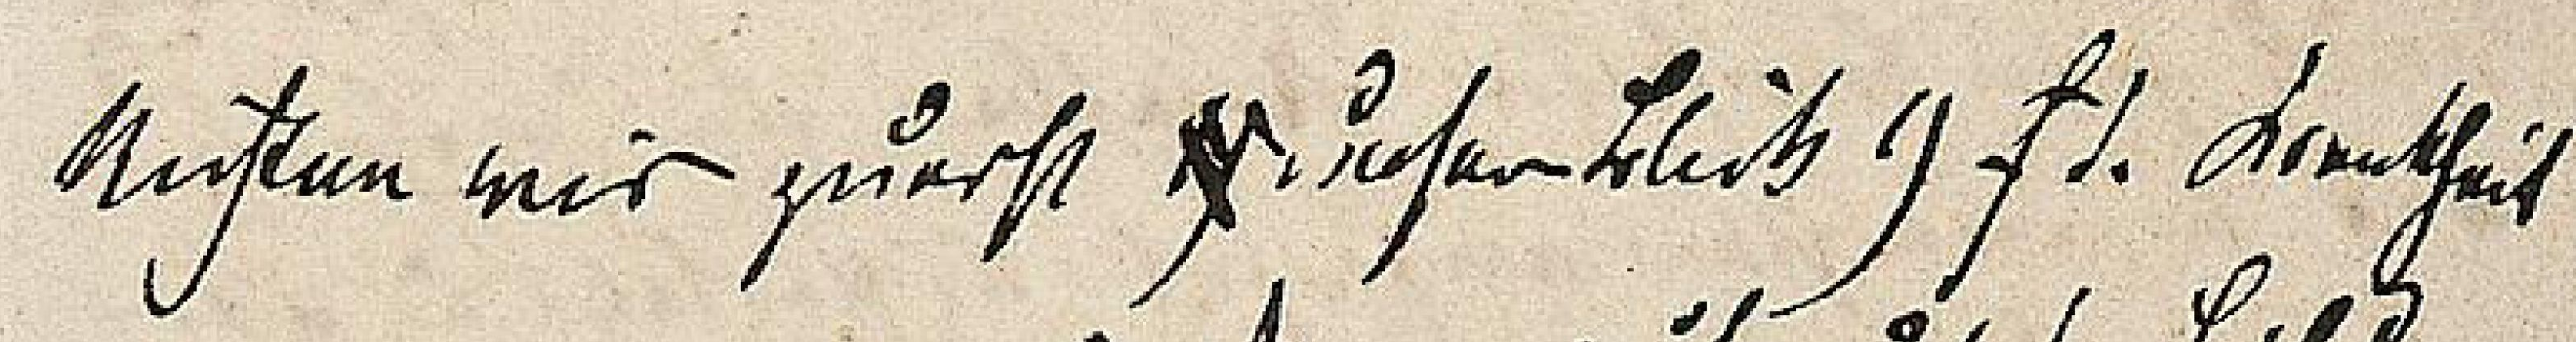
Richten wir zuerst zu unserm Blick 1) f. Krankheit
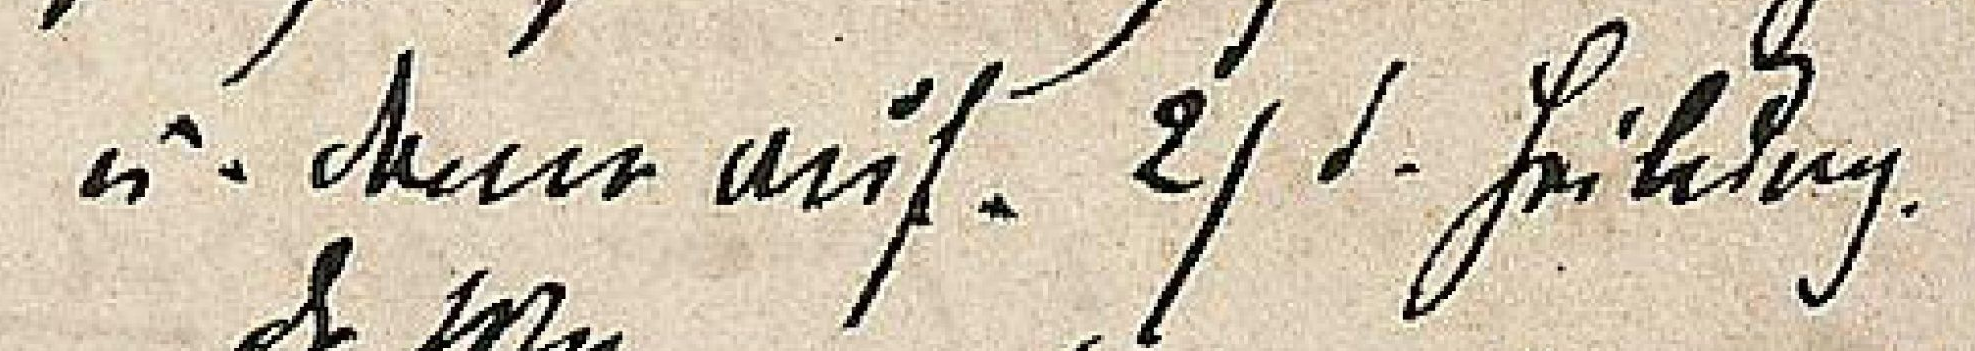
u. dann auf. 2) d. Heilung
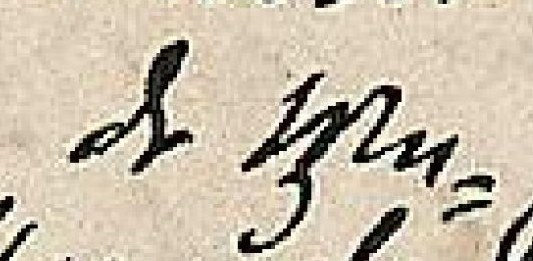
dr. Mn.
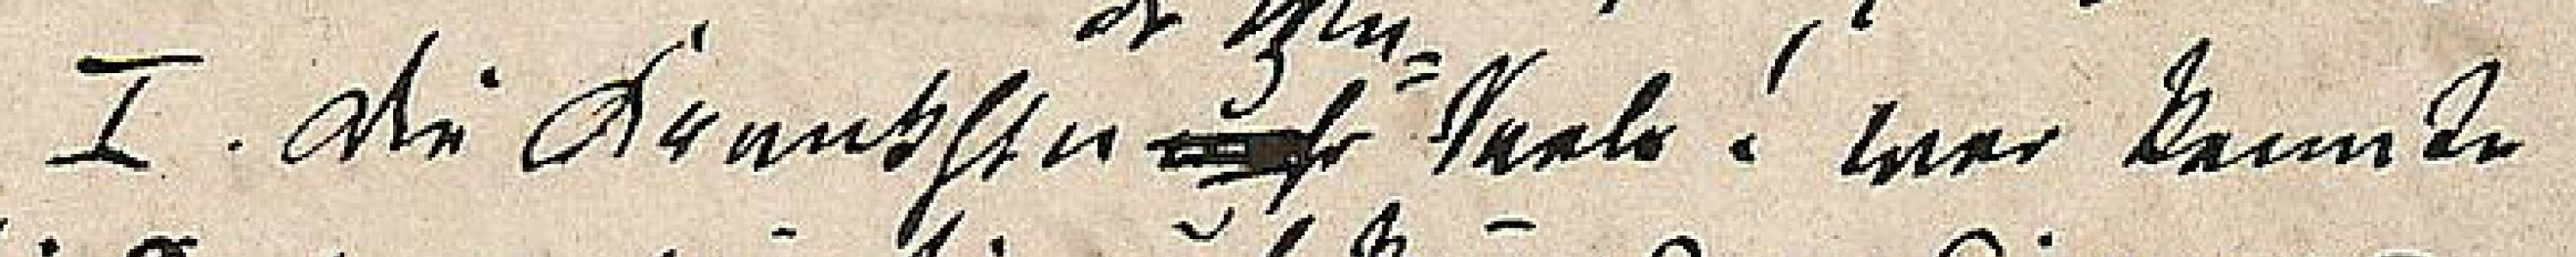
I. Die Krankhtn unsr. Seele! wer kennte
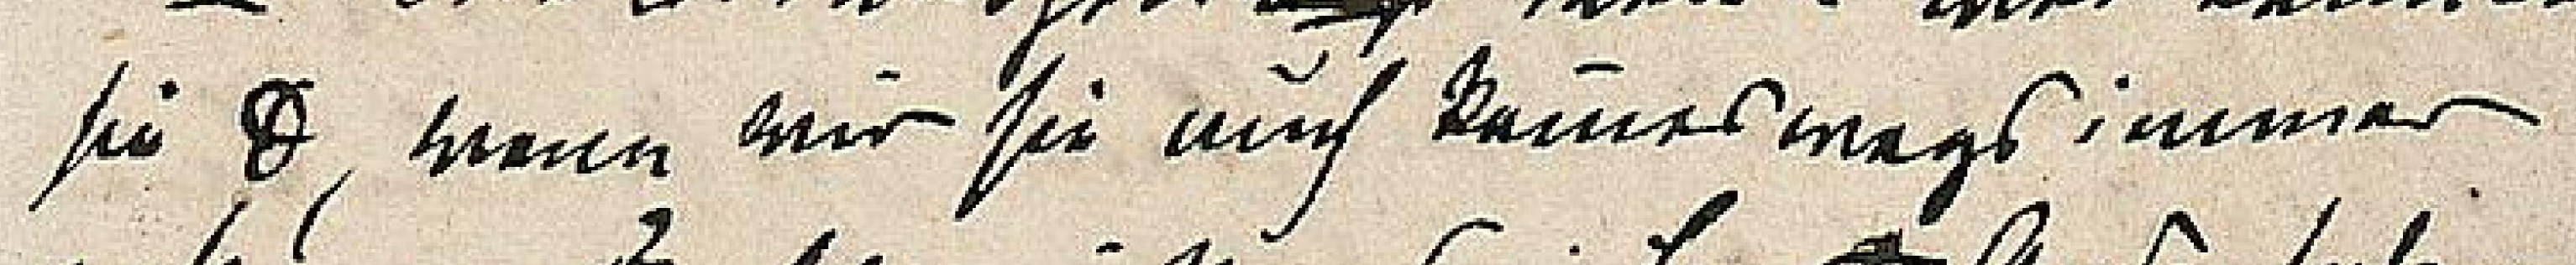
sie o, wenn wir sie auch keineswegs immer
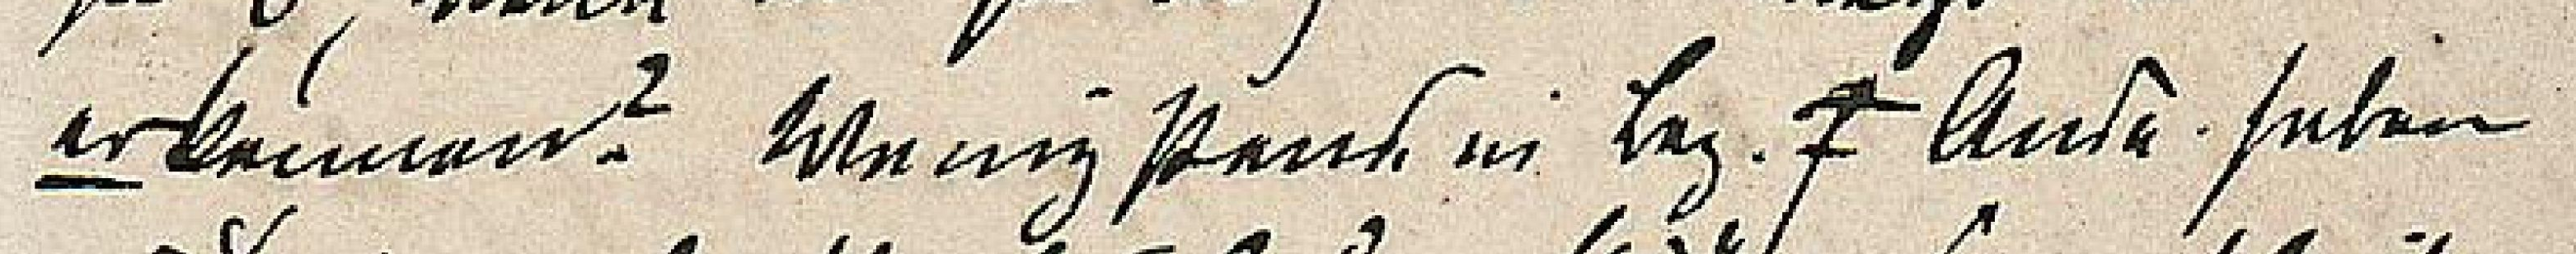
erkennen? Wenigstens in Bez. f Ande heben
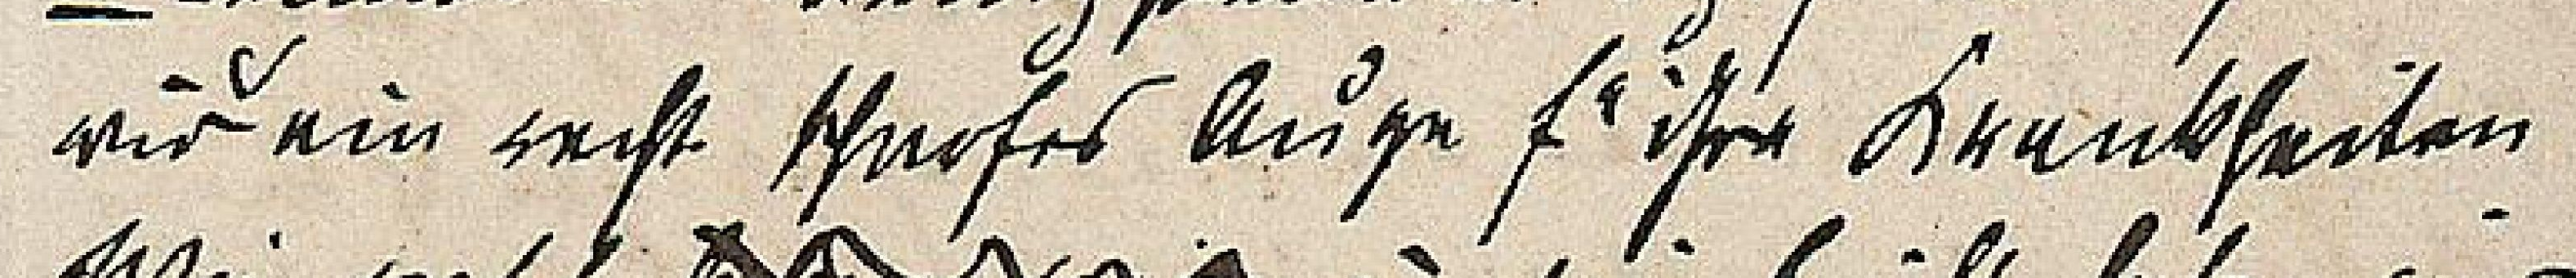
wir ein recht scharfes Auge f ihre Krankheiten
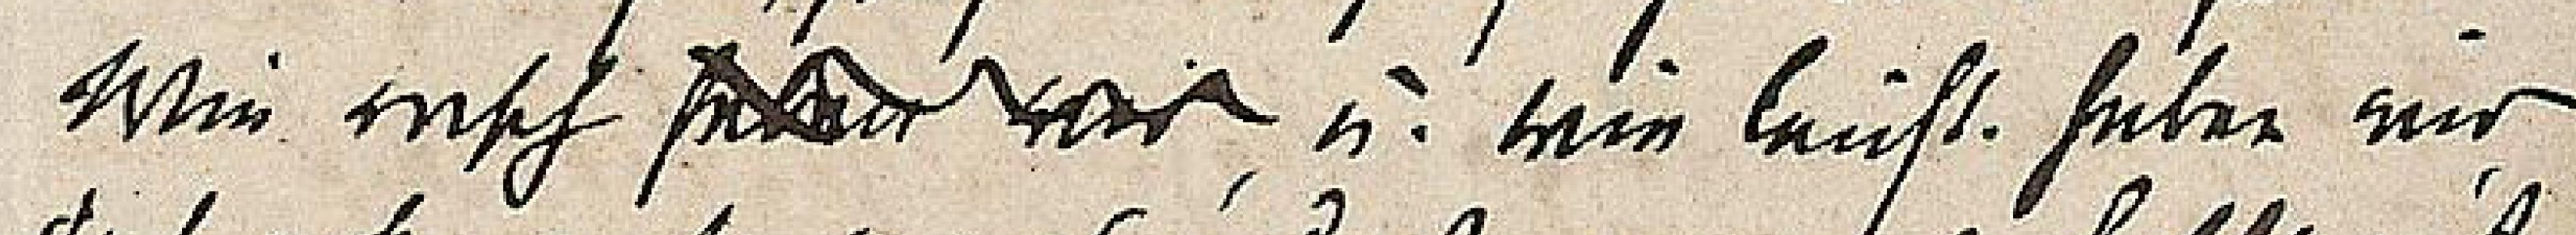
Wie rasch haben wir u. wie leicht. haben wird
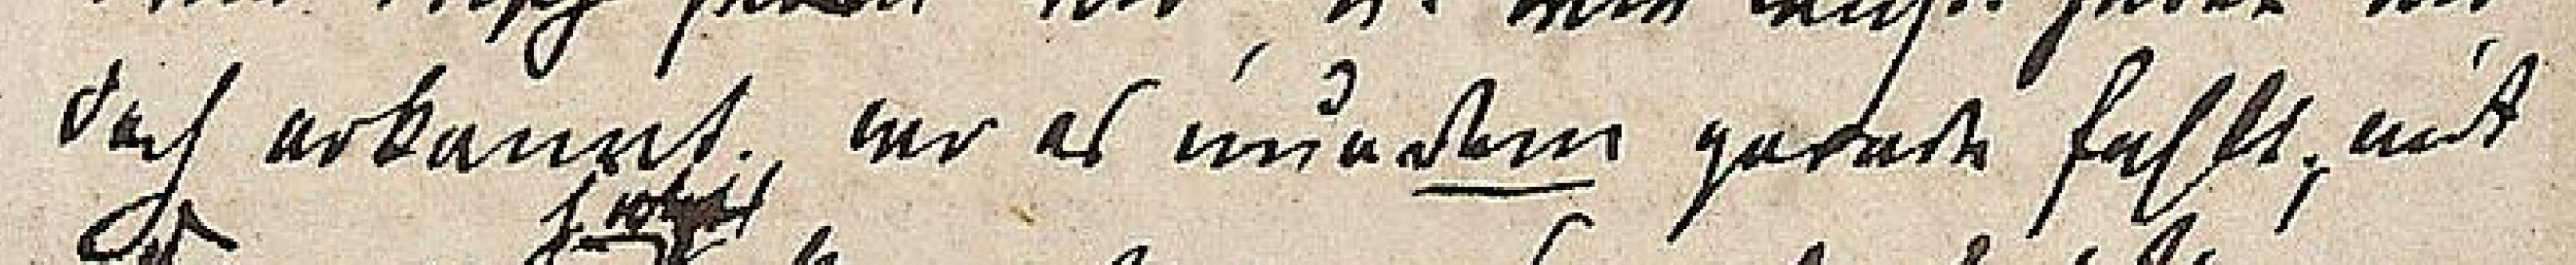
doch erkannt, wo es nun dem gerade gehlt, mit
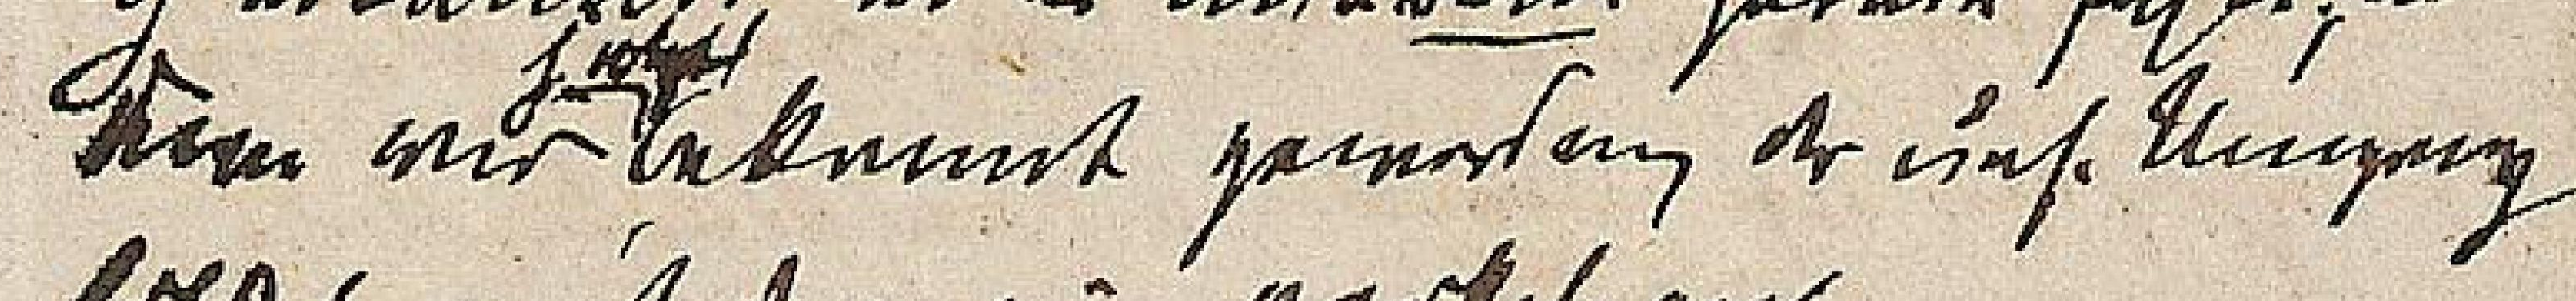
dem wir bekannt geworden, der uns. Umgang
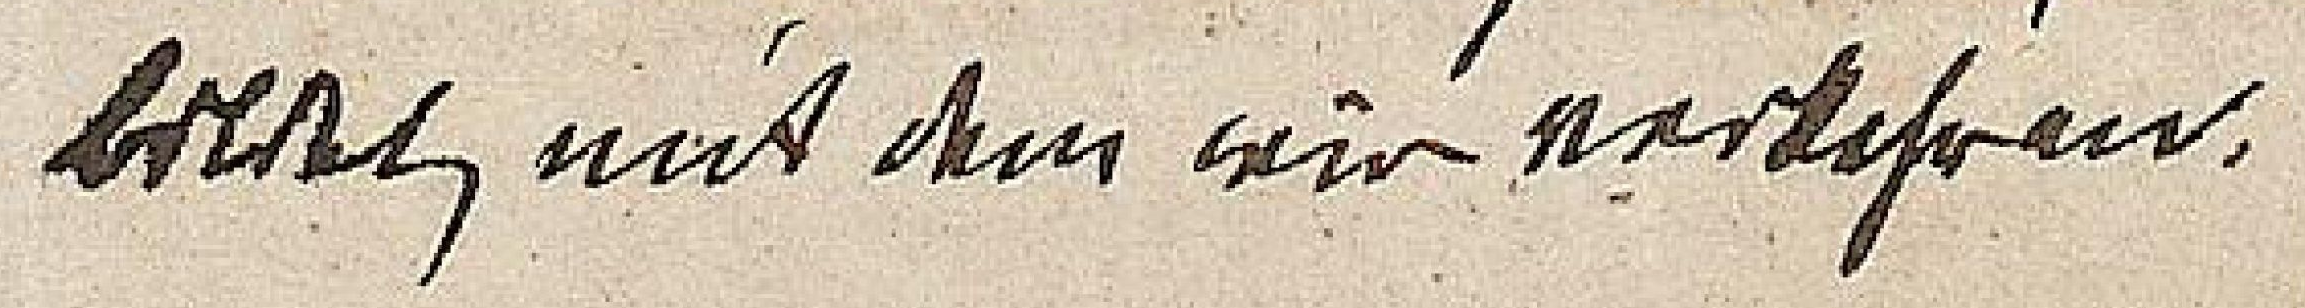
bildet, mit dem wir verkehren.
